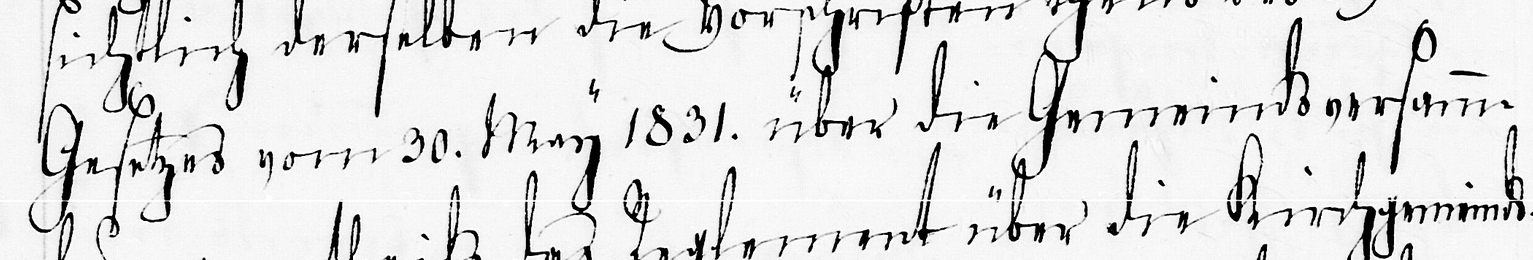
Gesetzes vom 30. May 1831. über die Gemeindsversamm¬
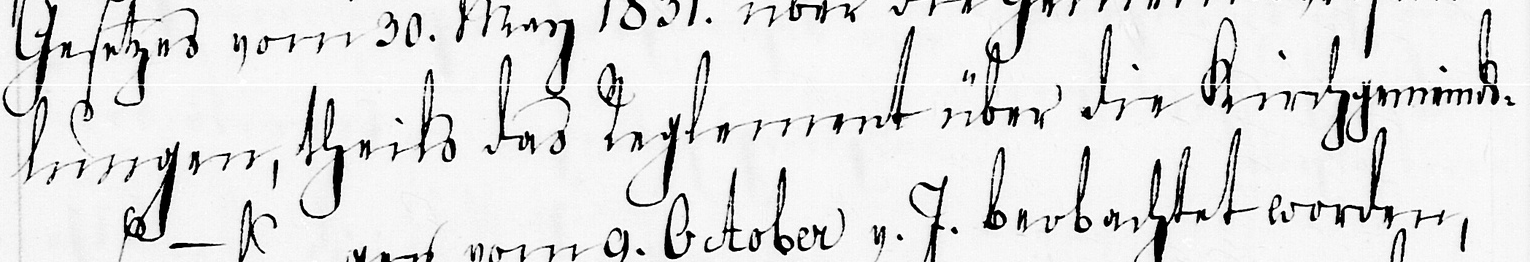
lungen, theils das Reglement über die Kirchgemeind¬
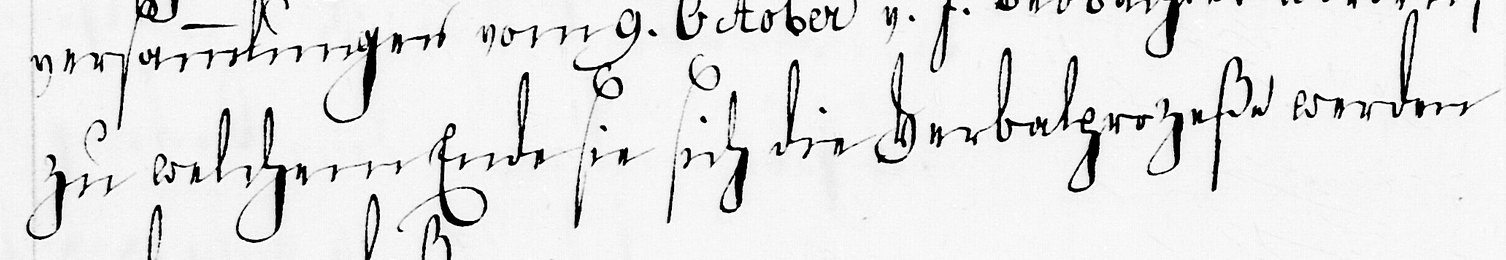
zu welchem Ende sie sich die Verbalprozeße werden
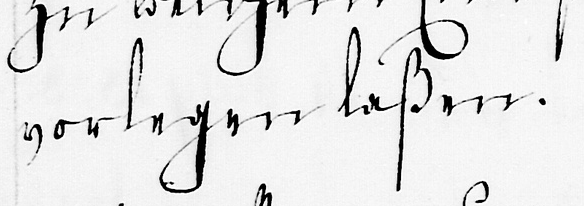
vorlegen laßen.
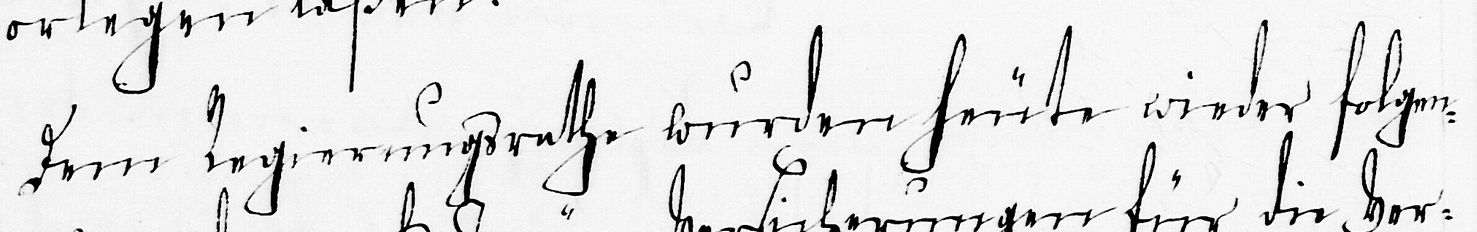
Dem Regierungsrathe wurden heute wieder folge¬
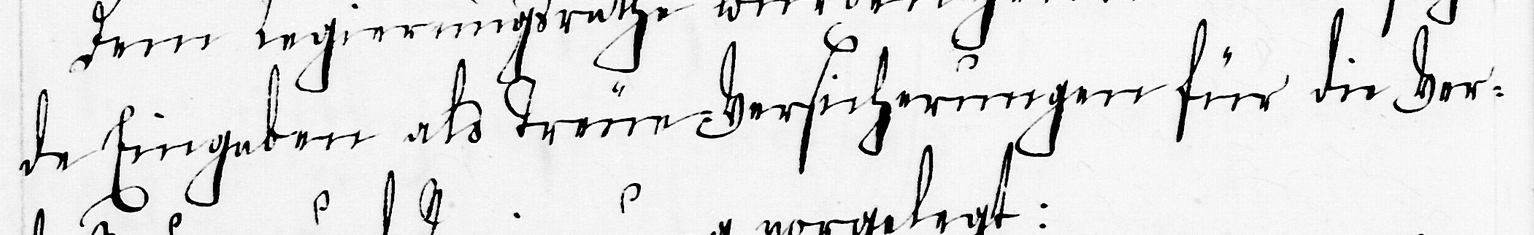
nde Eingaben als Treue-Versicherungen für die Ver¬
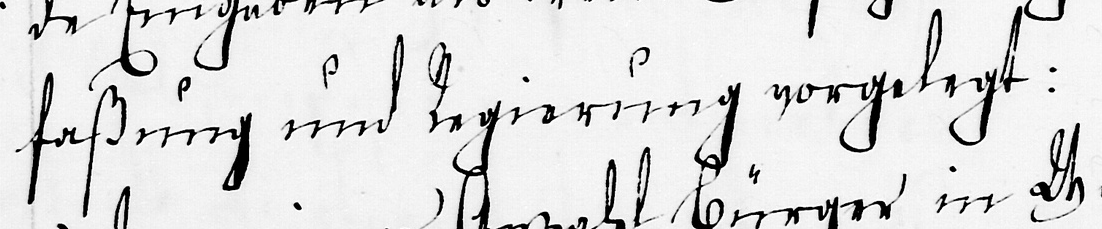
faßung und Regierung vorgelegt:
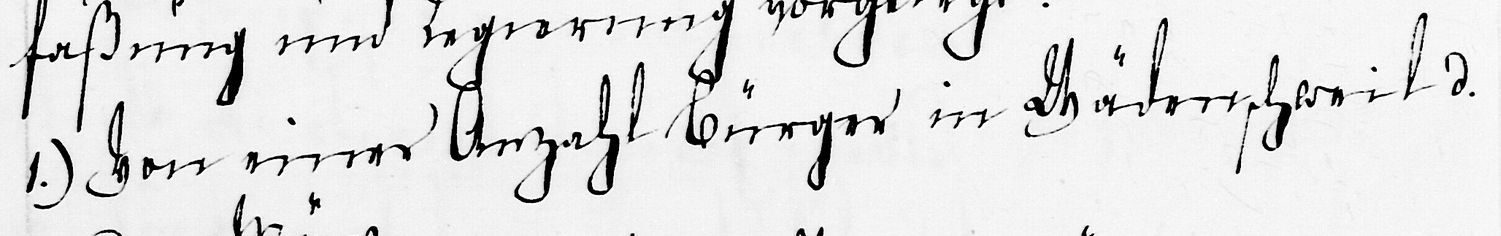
1.) Von einer Anzahl Bürger in Wädenschweil d.
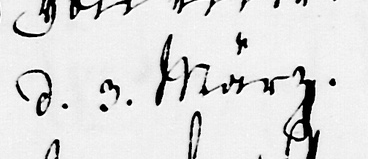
d. 3. März.
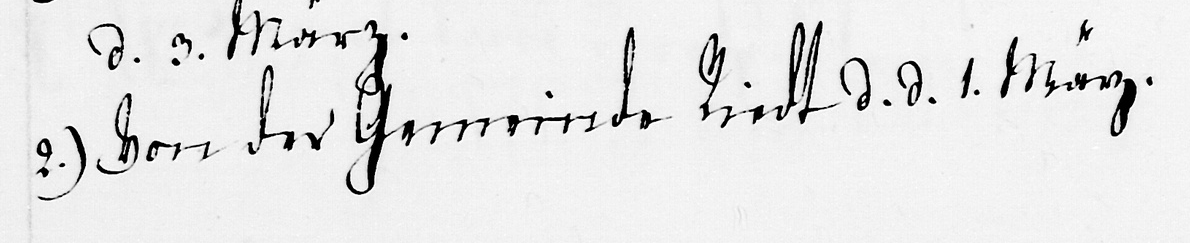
2.) Von der Gemeine Riedt d. d. 1. März.
